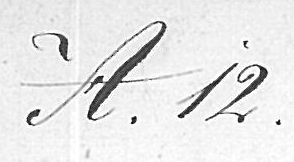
A. 12.
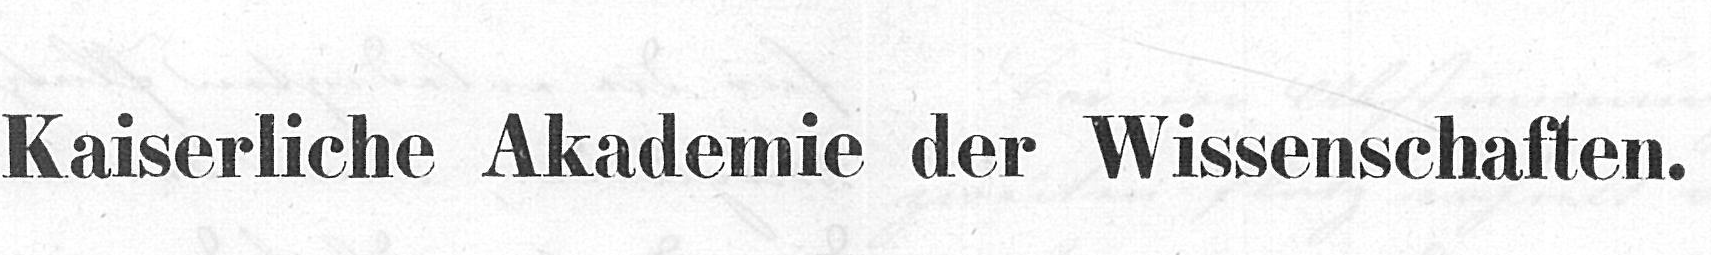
Kaiserliche Akademie der Wissenschaften.
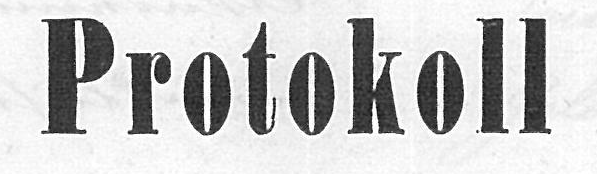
Protokoll
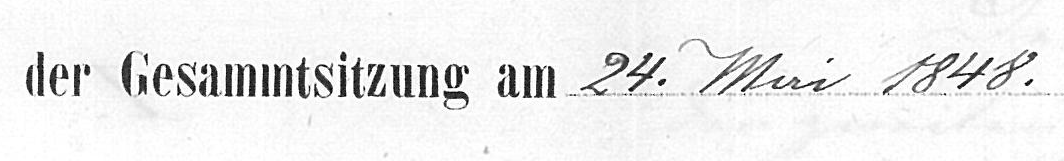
der Gesammtsitzung am 24. Mai 1848.
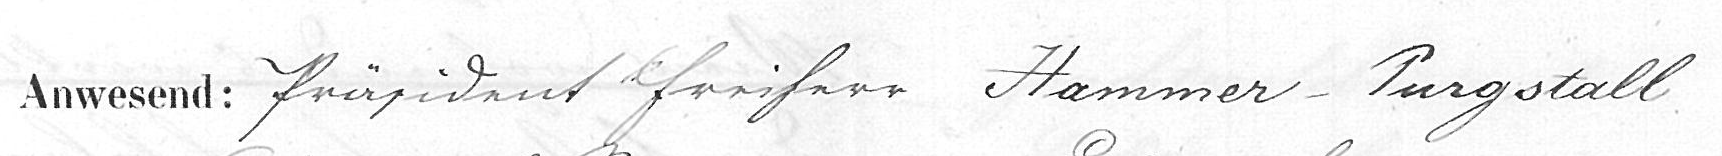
Anwesend: Präsident Freiherr Hammer-Purgstall
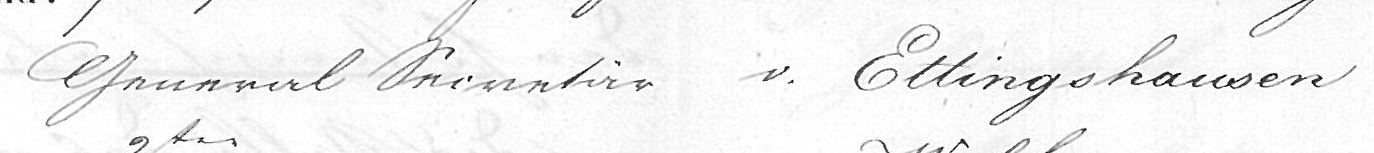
General Secretär v. Ettingshausen
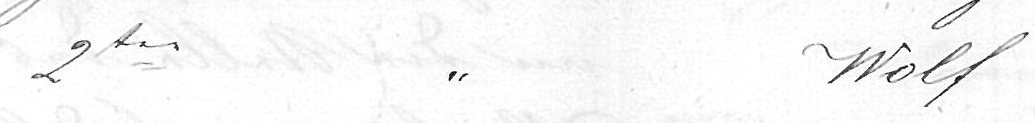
2ter " Wolf
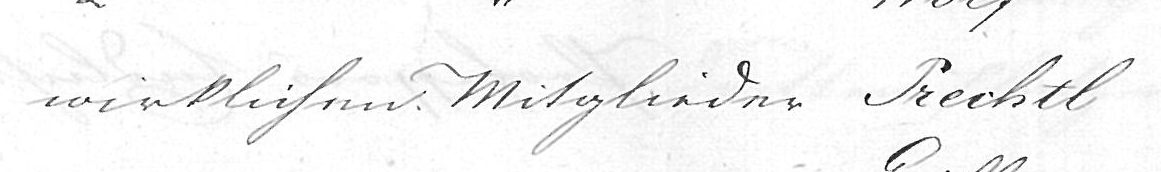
wirklichen Mitglieder Prechtl
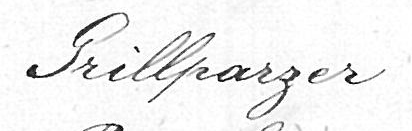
Grillparzer
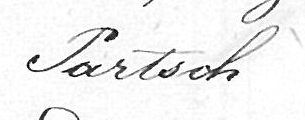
Partsch
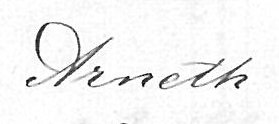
Arneth
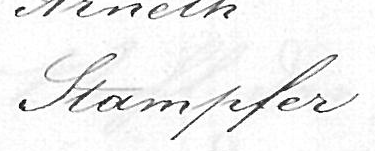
Stampfer
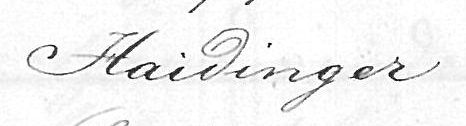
Haidinger
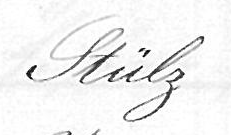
Stülz
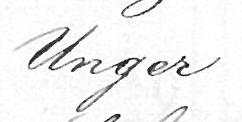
Unger
